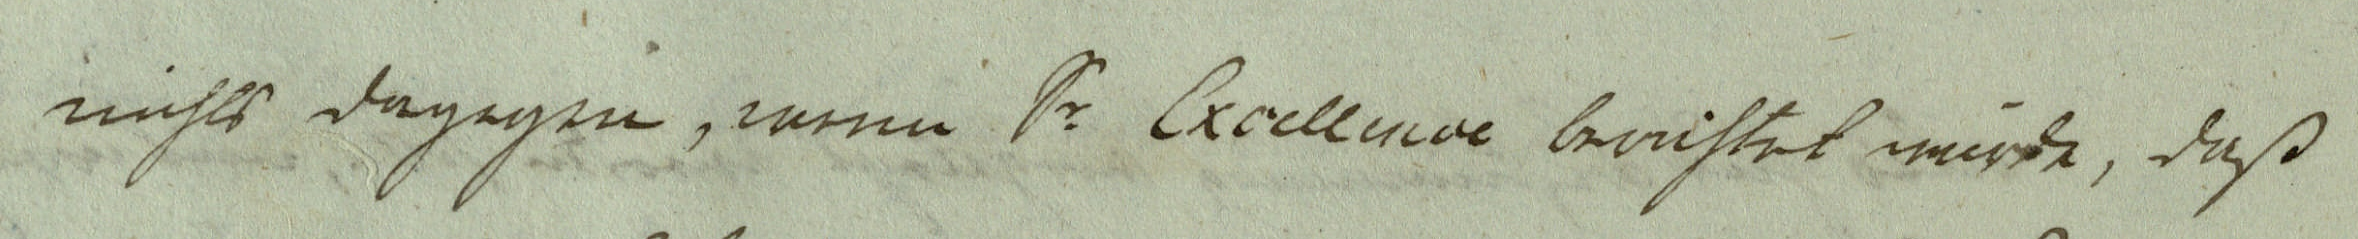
nichts dagegen, wenn Sr. Excellence berichtet würde, daß
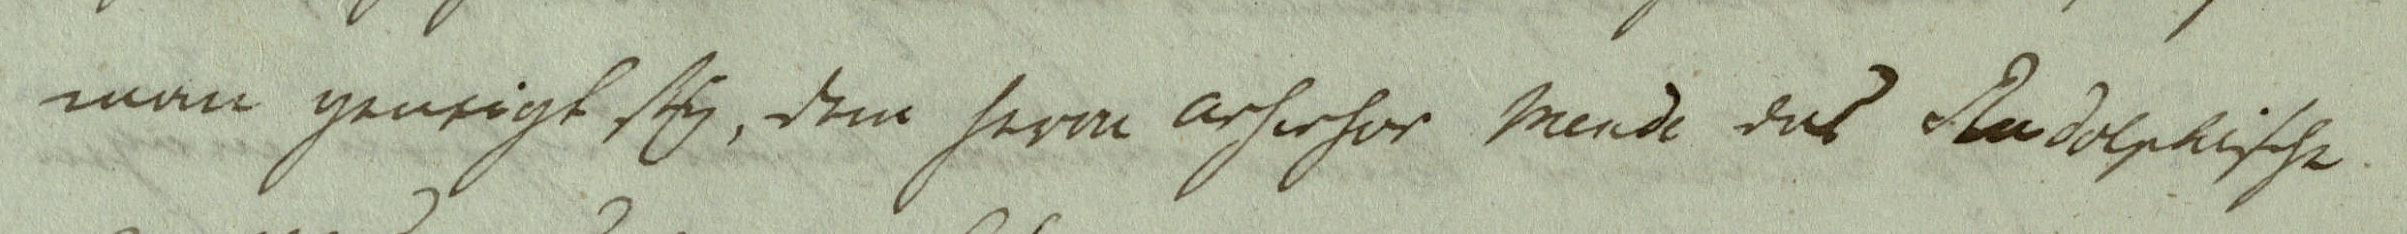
man geneigt seÿ, dem herrn Assessor Mende das Rudolphische
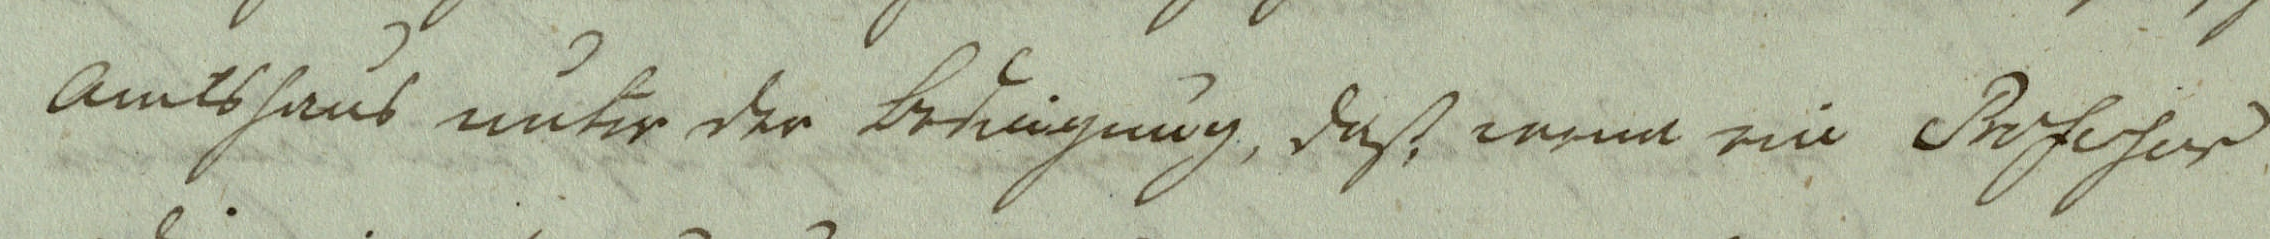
Amtshaus unter der Bedingung, daß wenn ein Professor
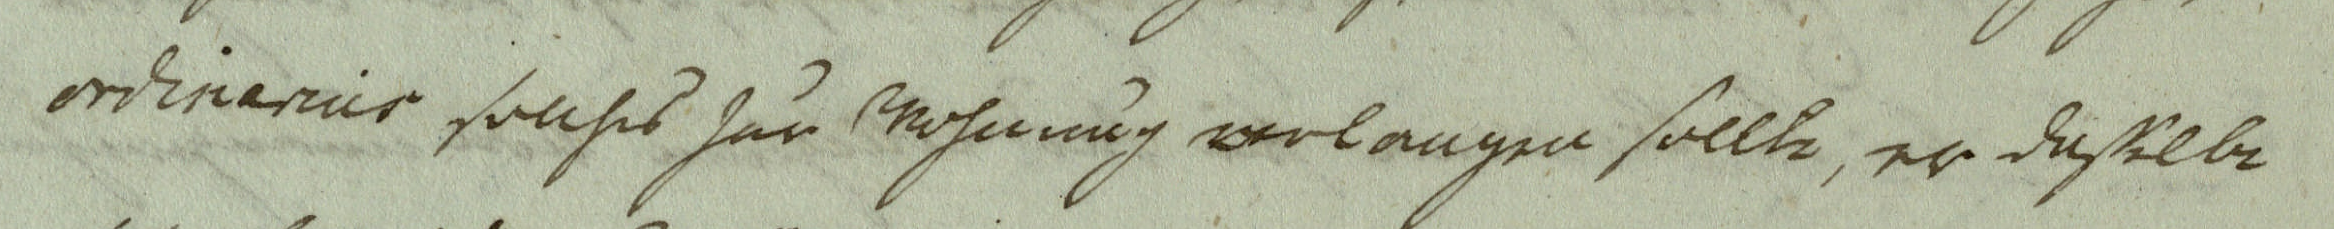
ordinarius solches zur Wohnung verlangen sollte, er dasselbe
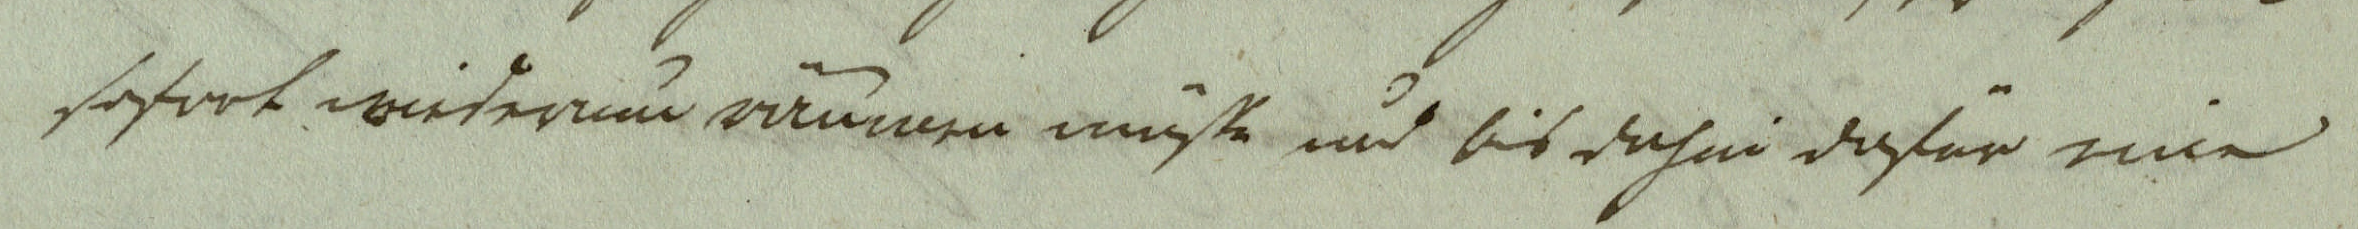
sofort wiederum räumen müsse und bis dahin dafür eine
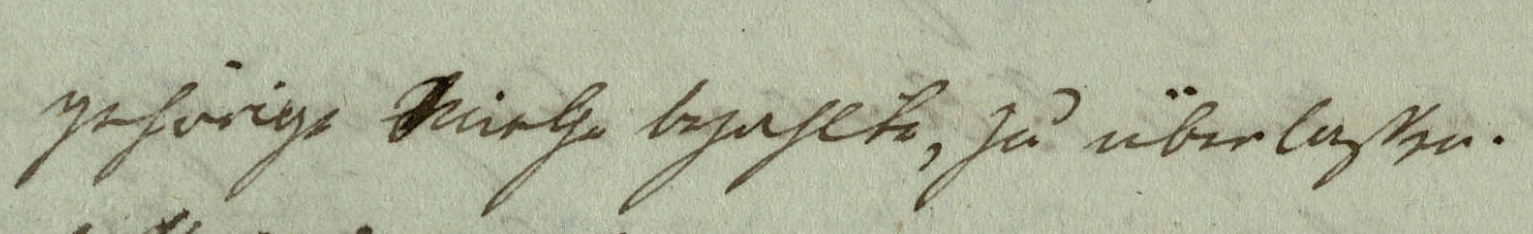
gehörige Miethe bezahlte, zu überlassen.
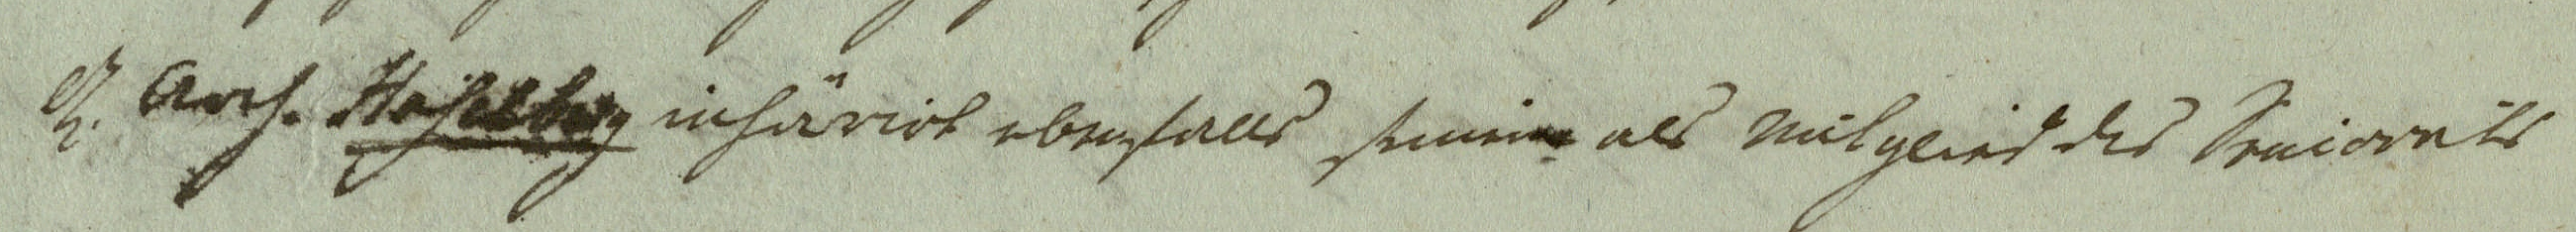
dh. Arch. Haselberg inhärirt ebenfalls seinen als Mitglied des Seniorats
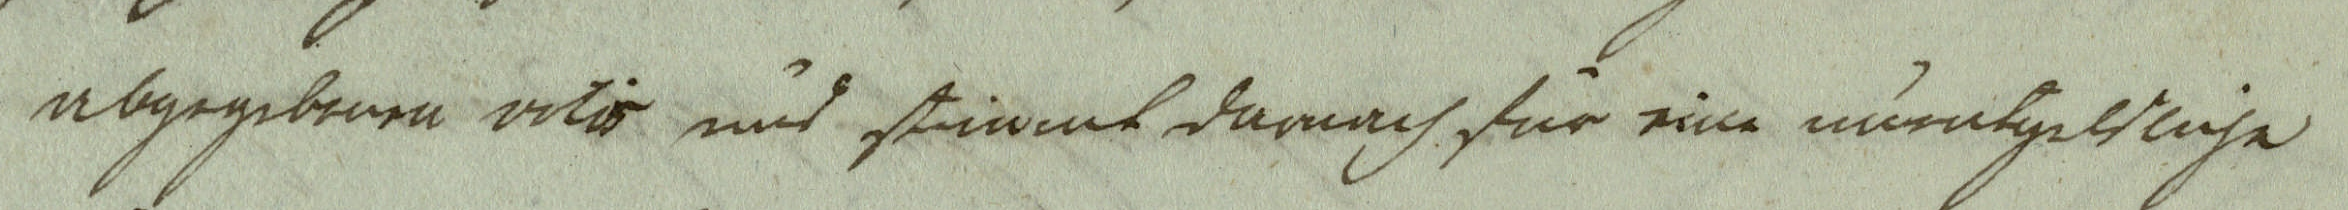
abgegebenen votis und stimmt darnach für eine unentgeldliche
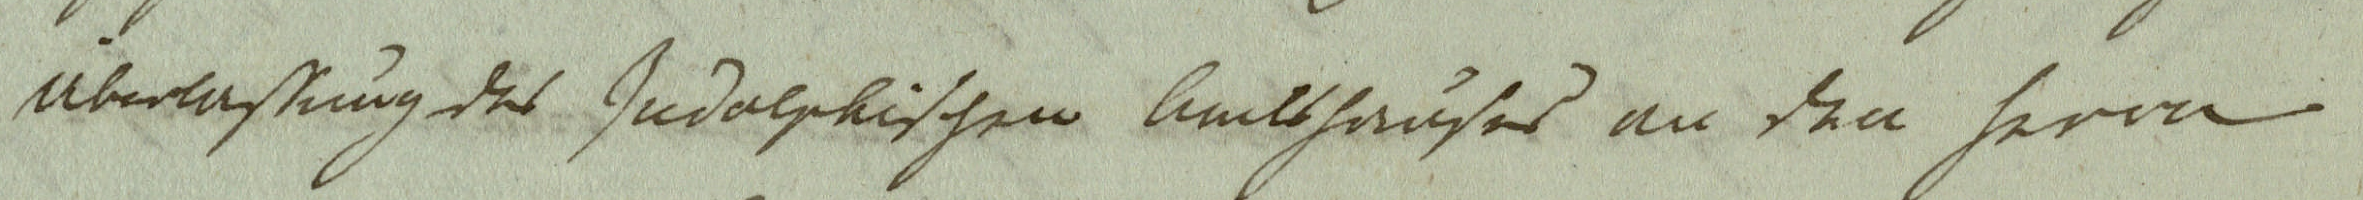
Überlassung des Rudolphischen Amtshauses an den herrn
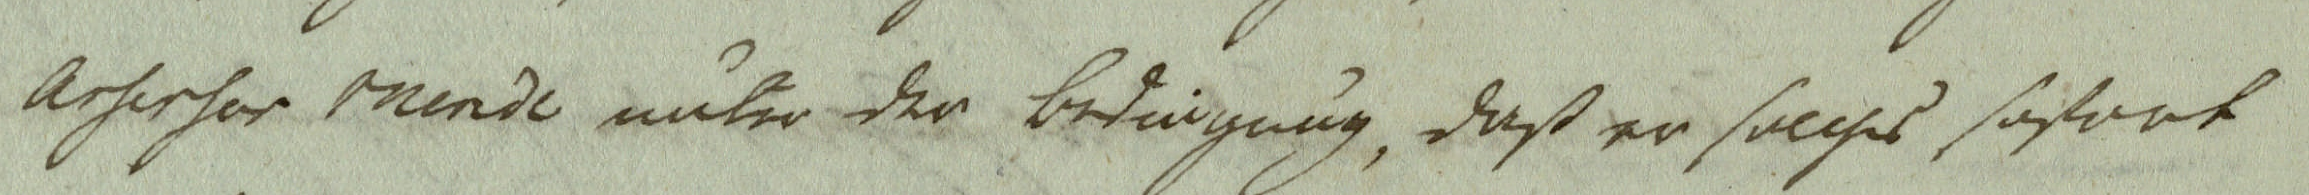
Assessor Mende unter der Bedingung, daß er solches sofort
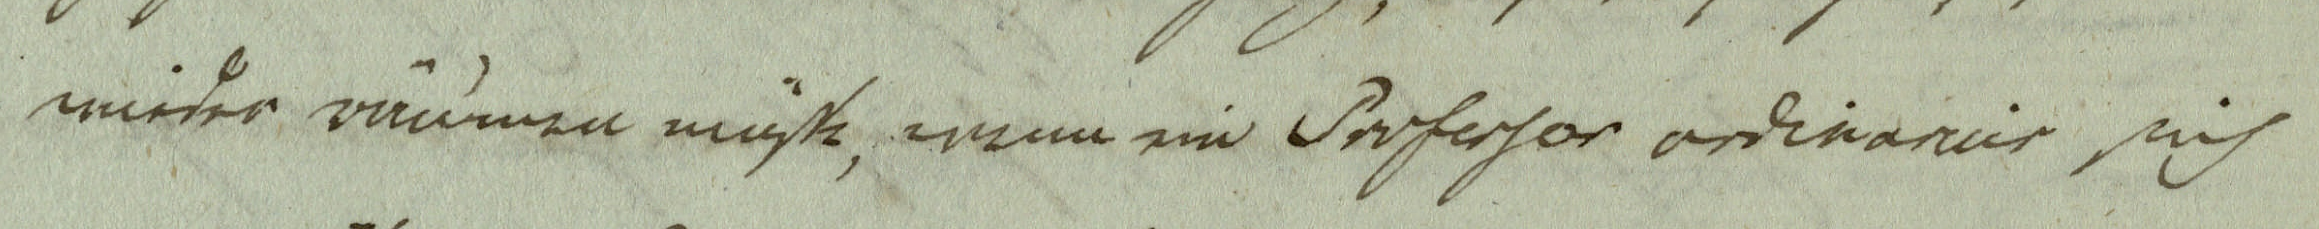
wieder räumen müsse, wenn ein Professor ordinarius sich
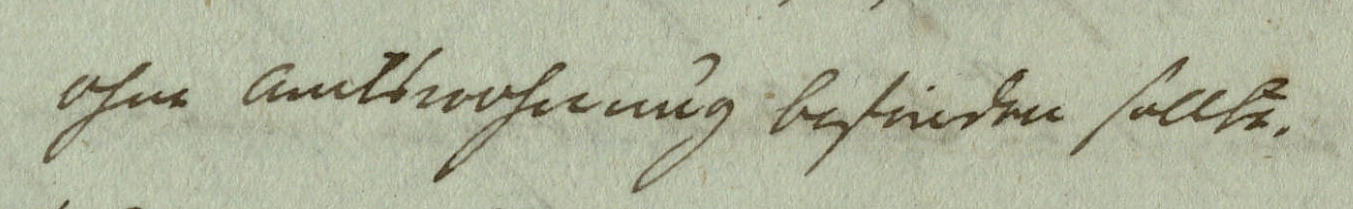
ohne Amtswohnung befinden sollte.
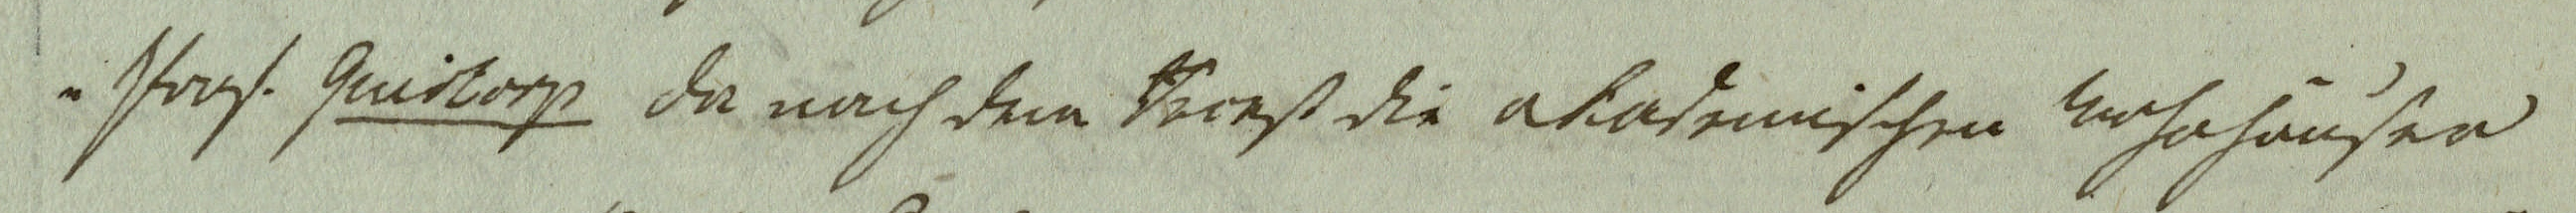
Prof. Quistorp Da nach dem Receß die akademischen Wohnhäuser
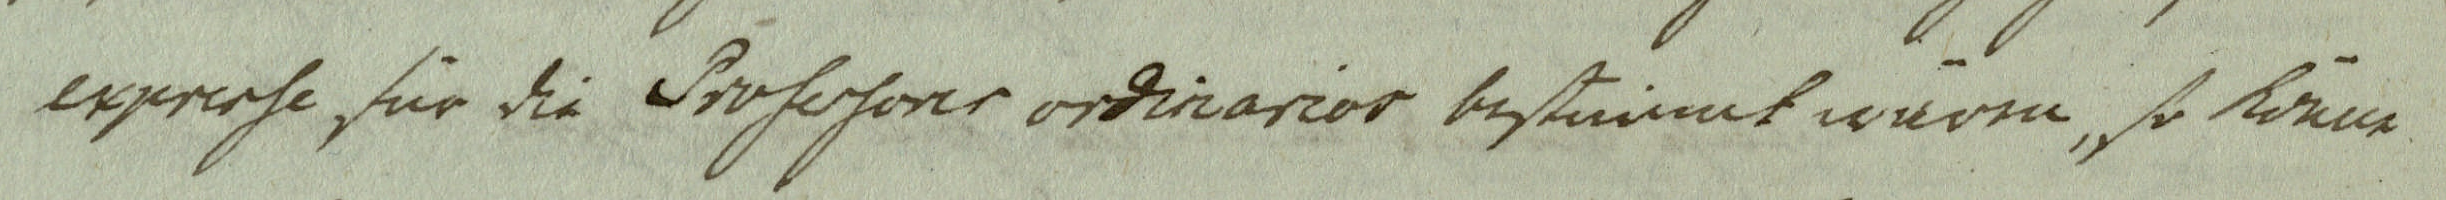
expresse für die Professores ordinarios betimmt wären, so könne
